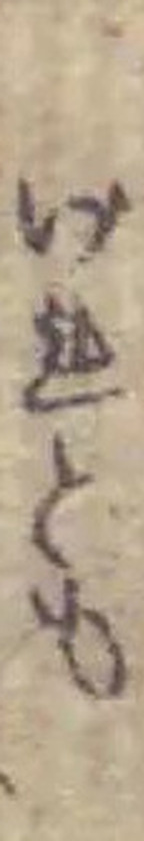けれども
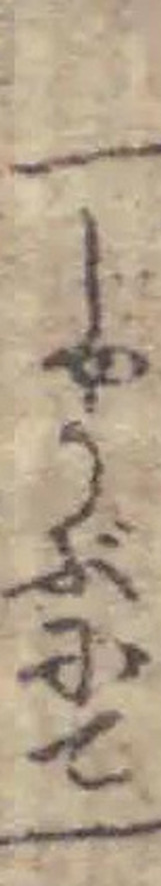じやうぶにて
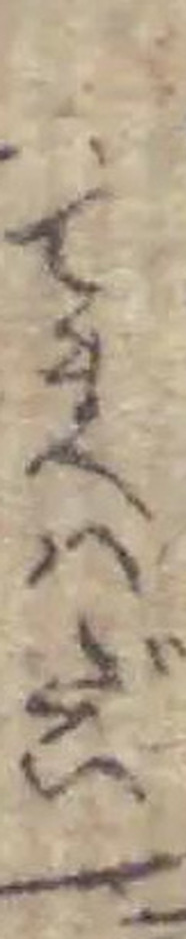てまへはだい
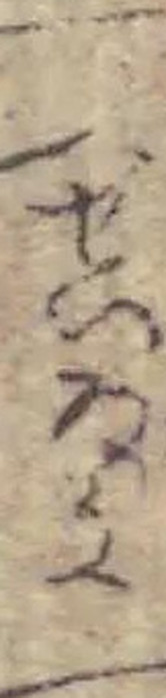せいろうへ
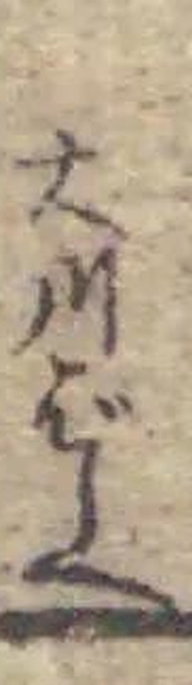大川ばしへ
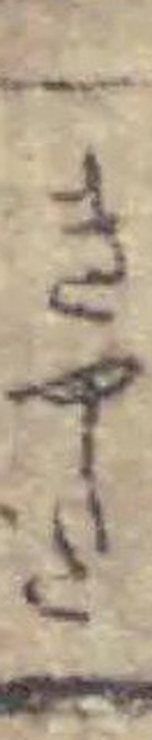きやした

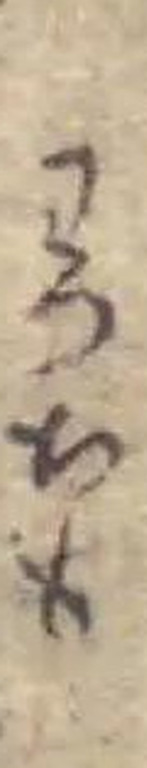わつちも
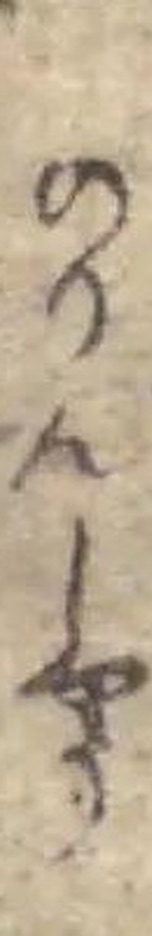のりんしやう
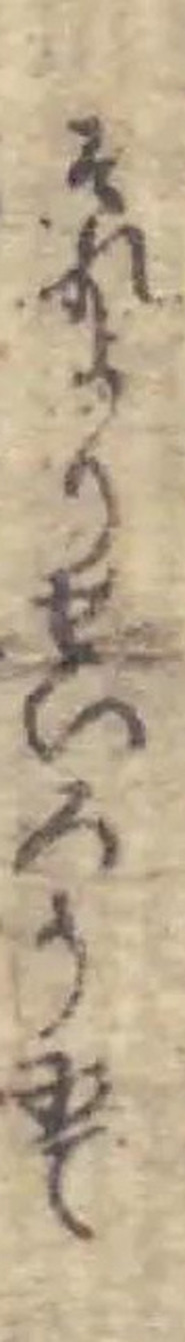それよりせいろうにて
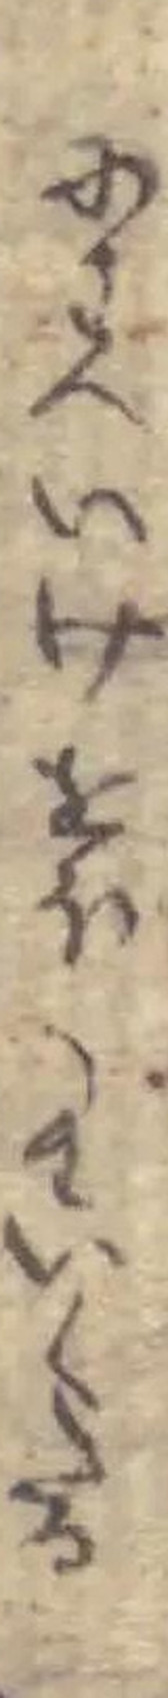にわへいけをほりいくたる
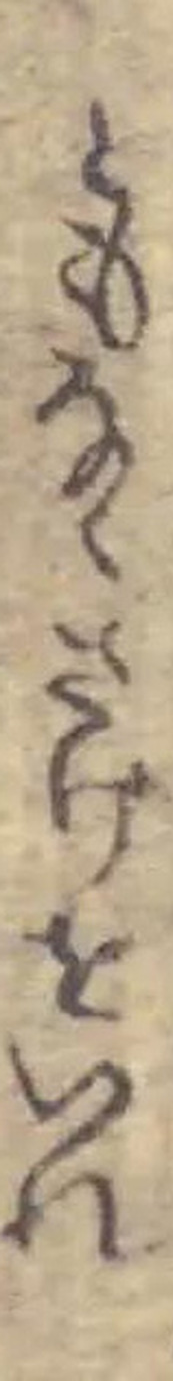ともなくさけをいれ
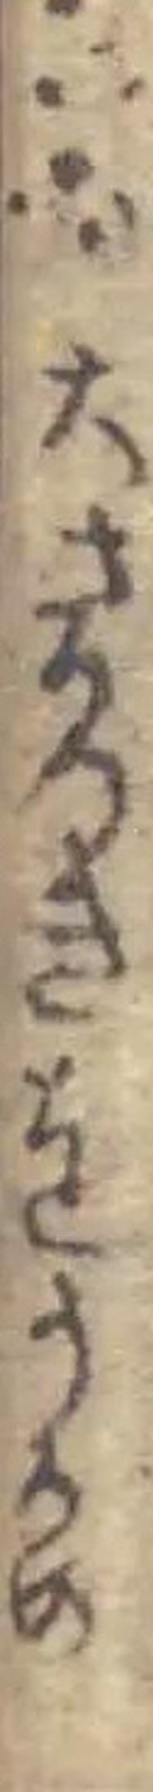大さかつきをうかめ
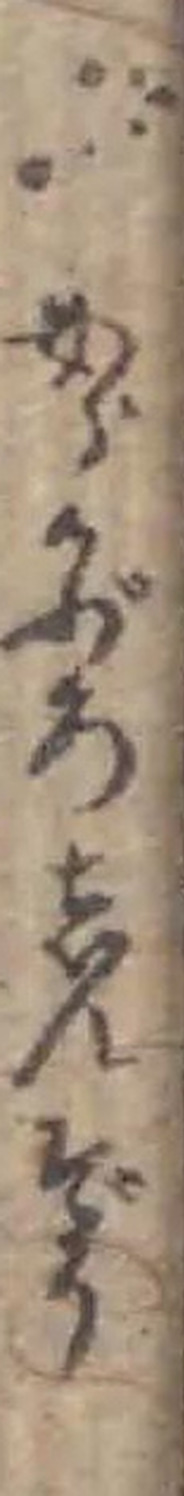女郎かぶろしんぞう
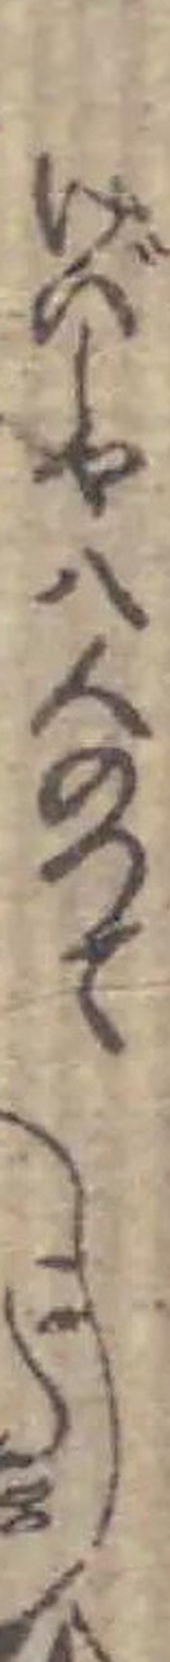げいしや八人のつて
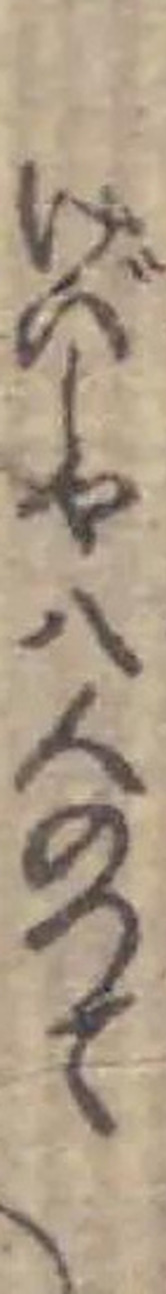げいしや八人のつて
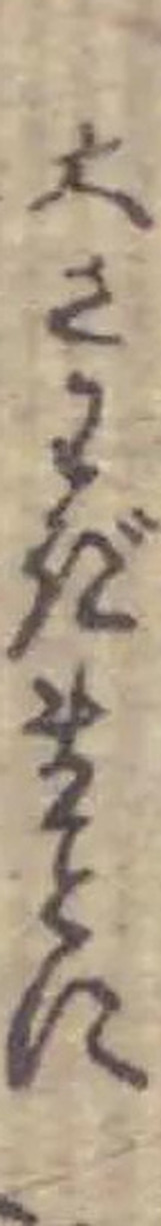大さわぎまことに
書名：飲中八人前 3巻
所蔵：国立国会図書館 National Diet Library, JAPAN
